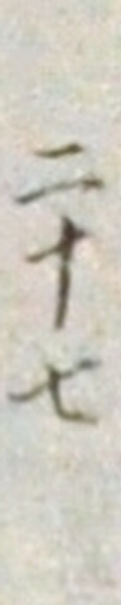二十七
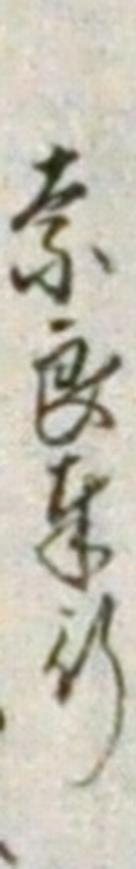奈良奉行
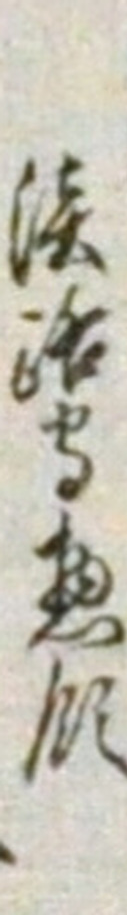淡路守惣領
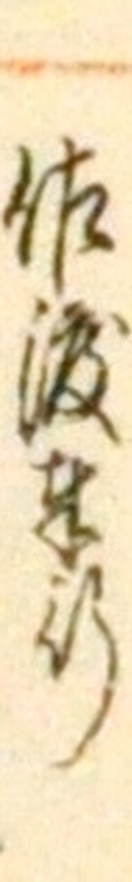佐渡奉行
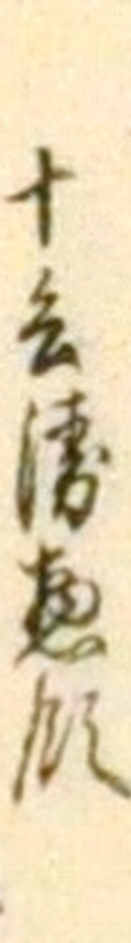十兵衛惣領
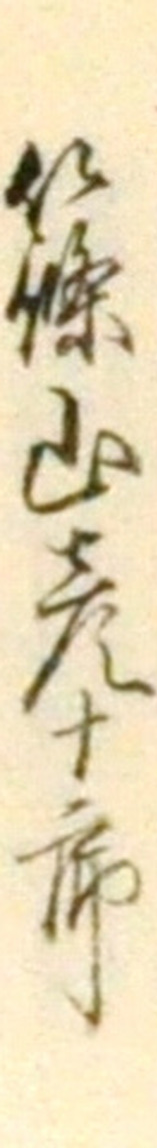篠山彦十郎
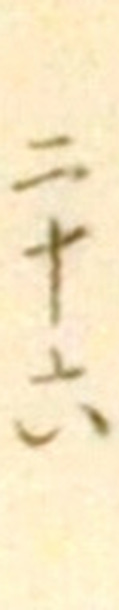二十六

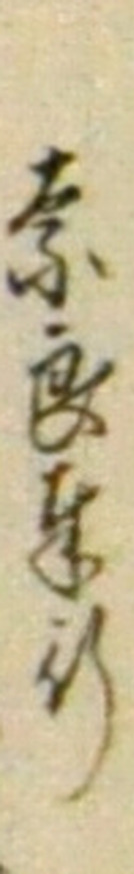奈良奉行
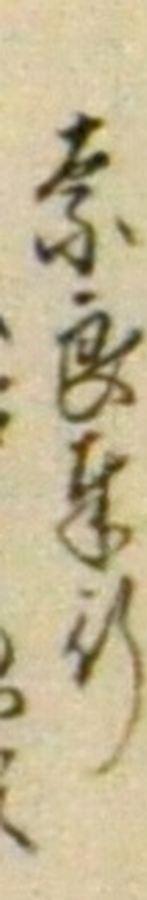奈良奉行
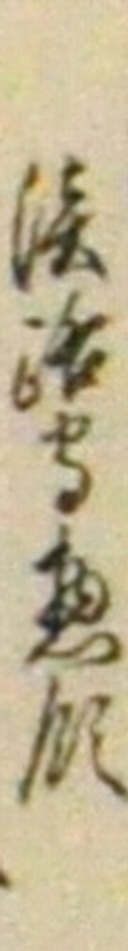淡路守惣領
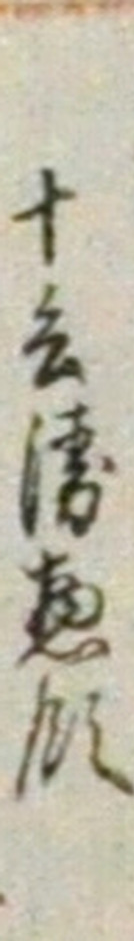十兵衛惣領
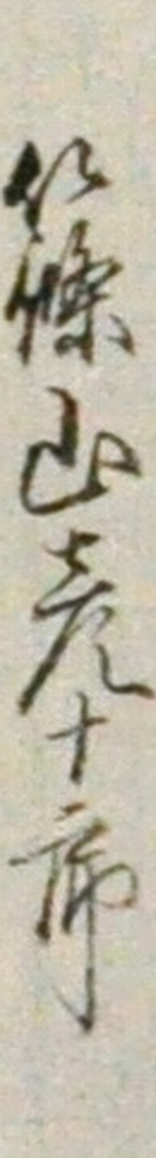篠山彦十郎
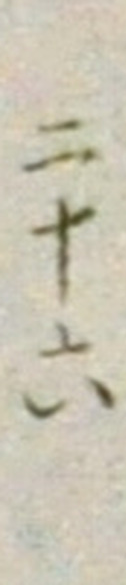二十六
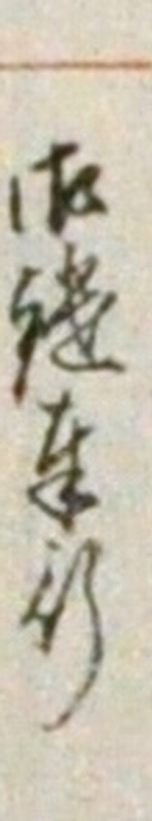御鑓奉行
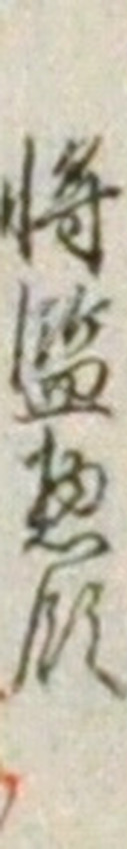将監惣領
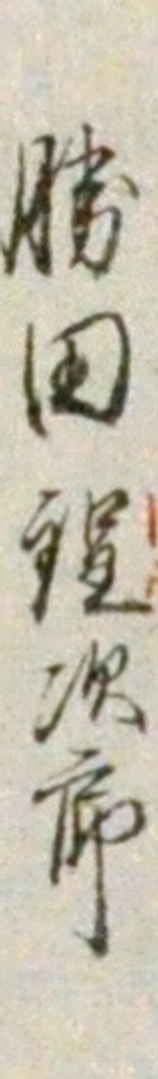勝田鋥次郎
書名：若年寄御役中之御書物〔一括〕
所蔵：伊那市立高遠町図書館・合同会社AMANE
